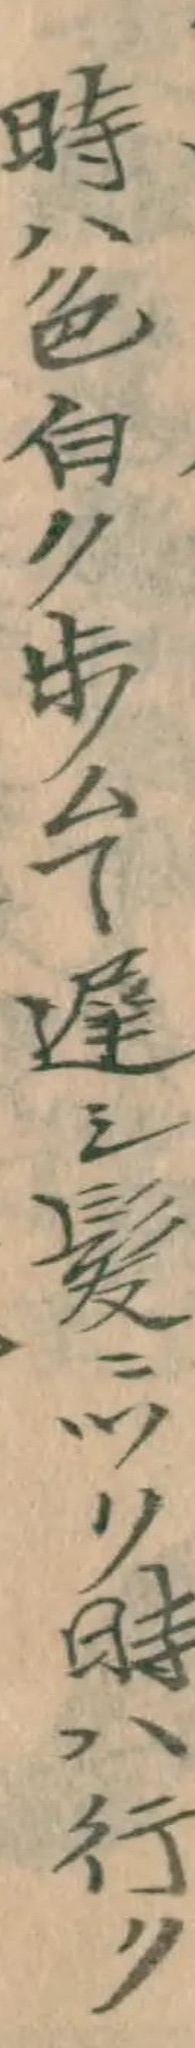時ハ色白ク歩ムコト遅シ髪ニツク時ハ行ク
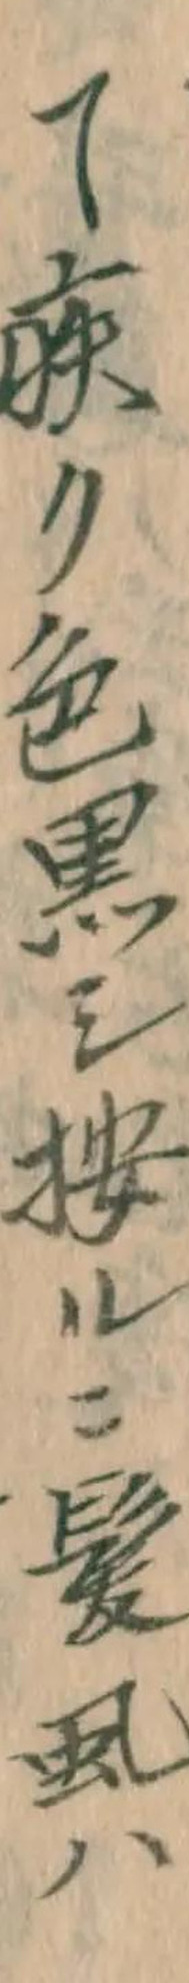コト疾ク色黒シ按ルニ髪虱ハ
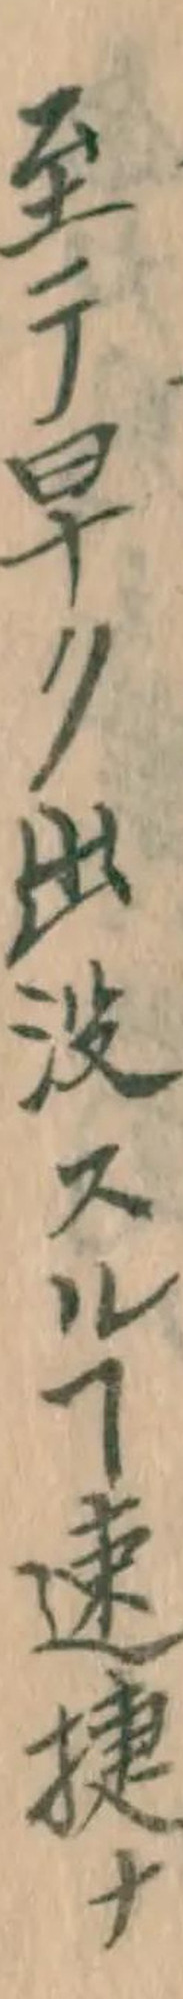至テ早ク出没スルコト速捷ナ
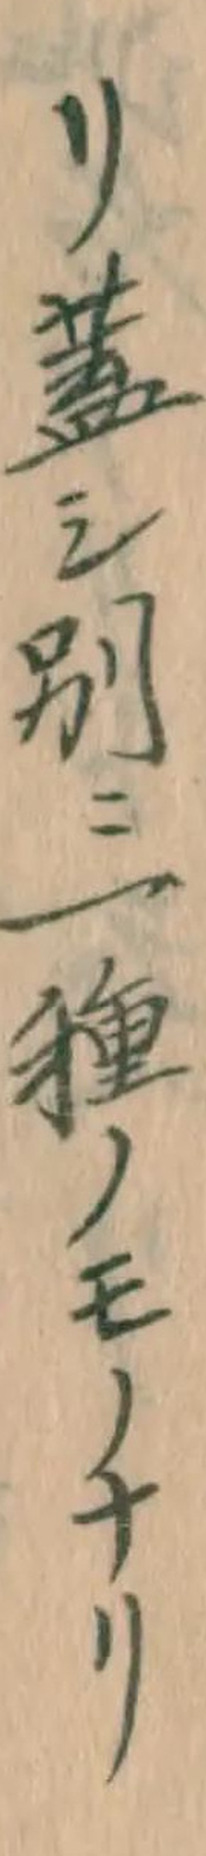リ蓋シ別ニ一種ノモノナリ
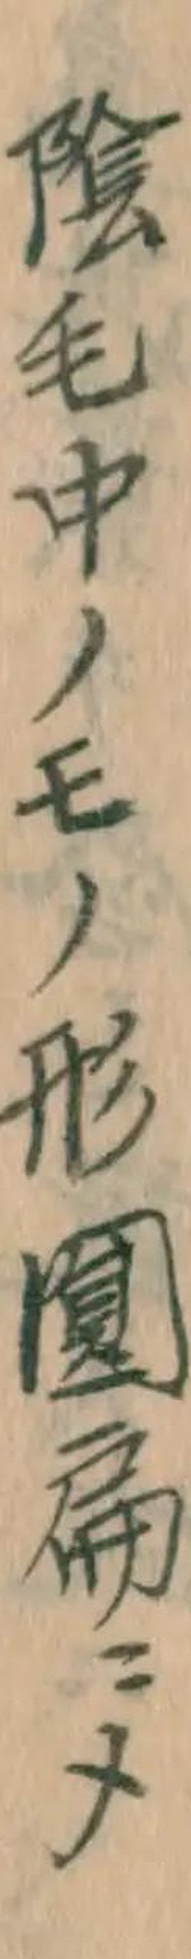陰毛中ノモノ形圓扁ニシテ
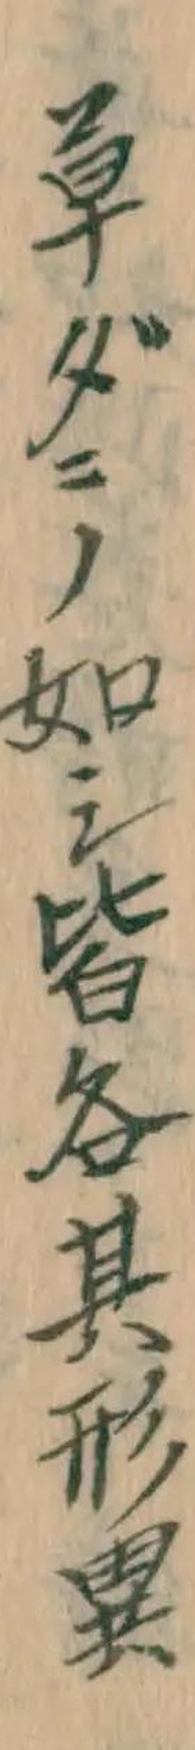草ダニノ如シ皆各其形異
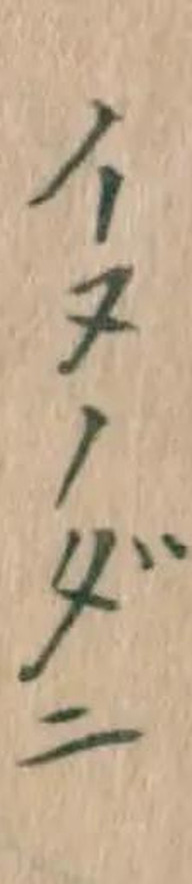イヌノダニ
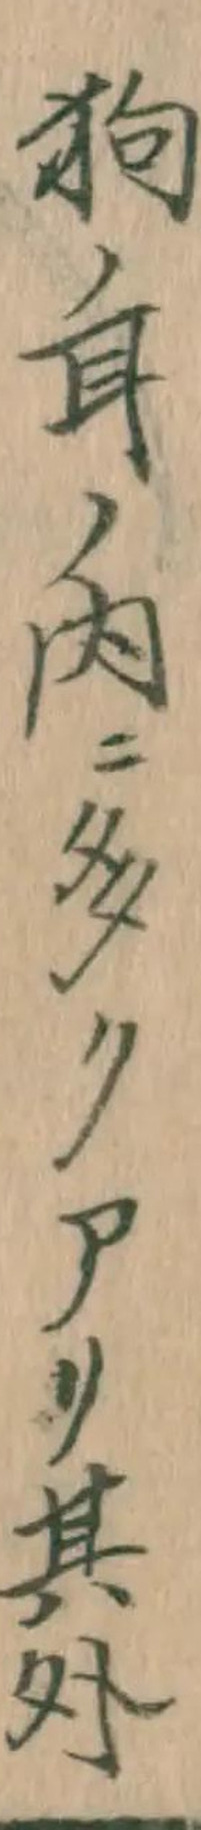狗ノ耳ノ内ニ多クアリ其外
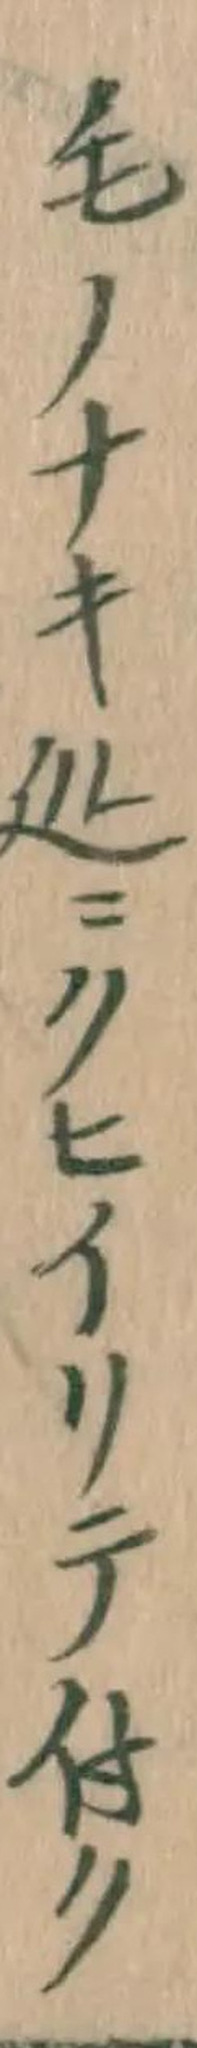毛ノナキ処ニクヒイリテ付ク
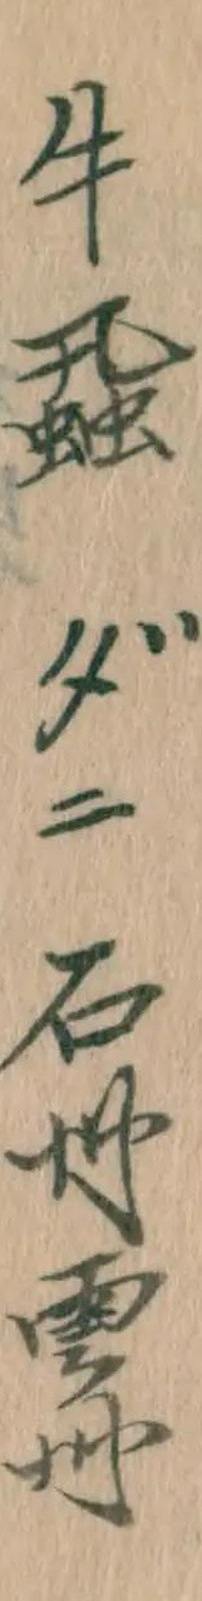牛蝨ダニ石州雲州
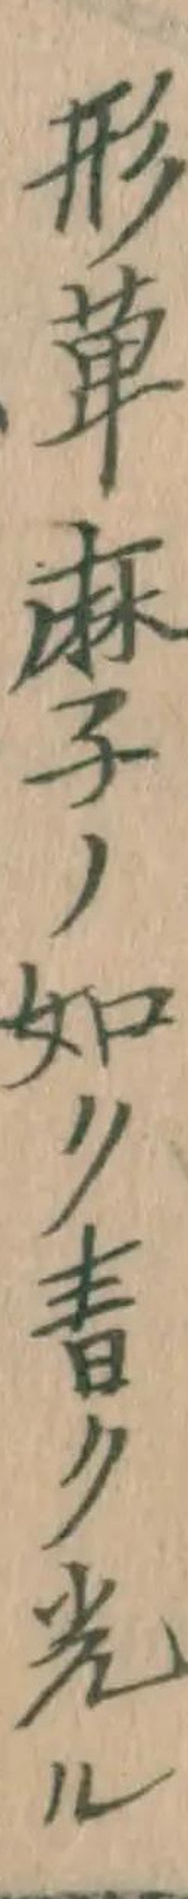形萆麻子ノ如ク青ク光ル
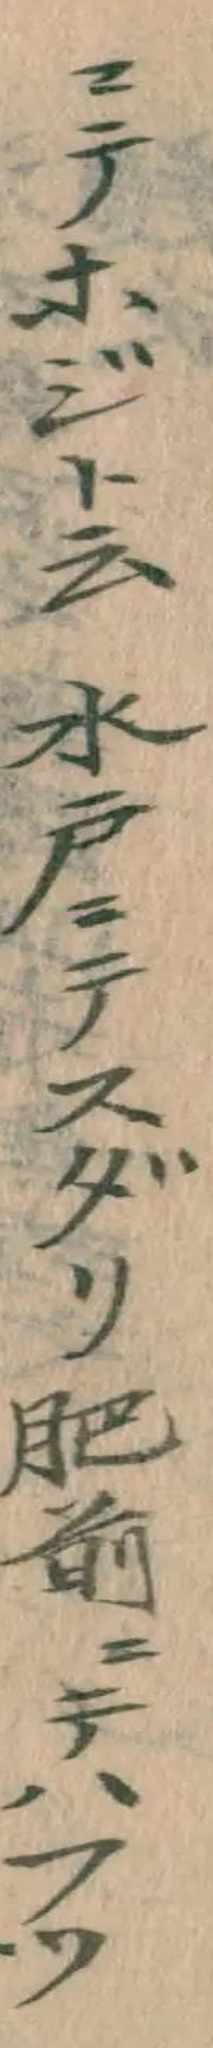ニテホジト云水戸ニテスダリ肥前ニテハフツ
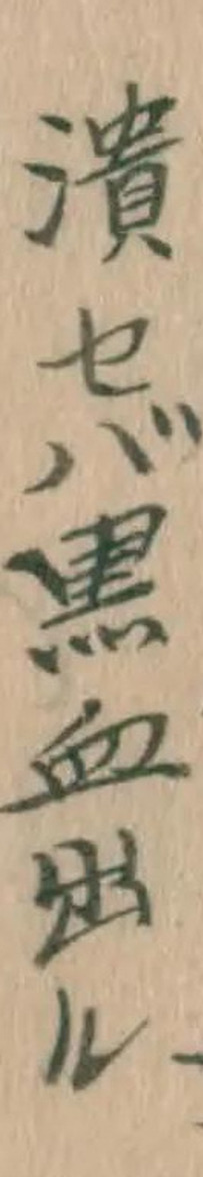潰セバ黒血出ル
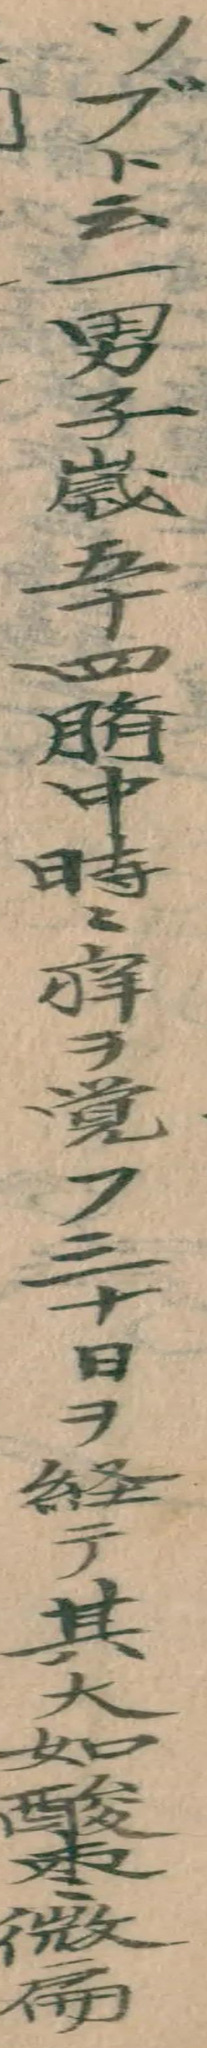ツブト云一男子歳五十四𦜝中時々痒ヲ覚フ三十日ヲ経テ其大如酸棗微扁
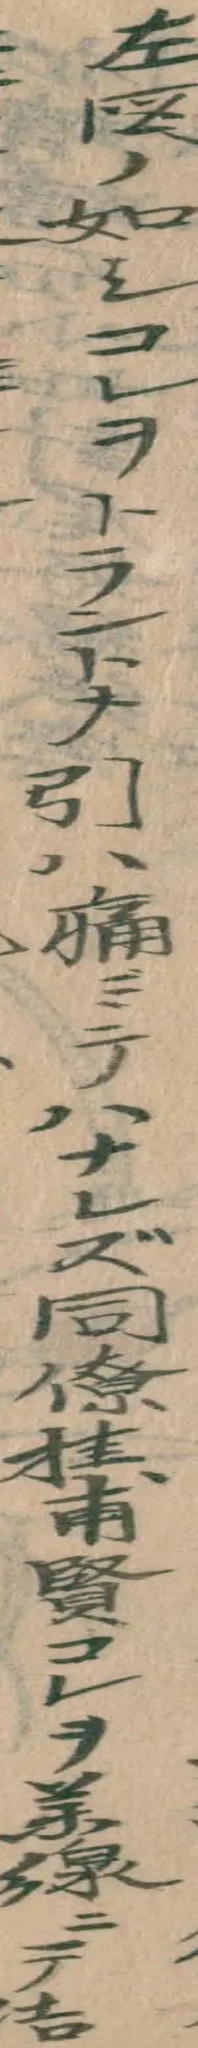左図ノ如シコレヲトラントシテ引ハ痛ミテハナレズ同僚桂甫賢コレヲ薬線ニテ結
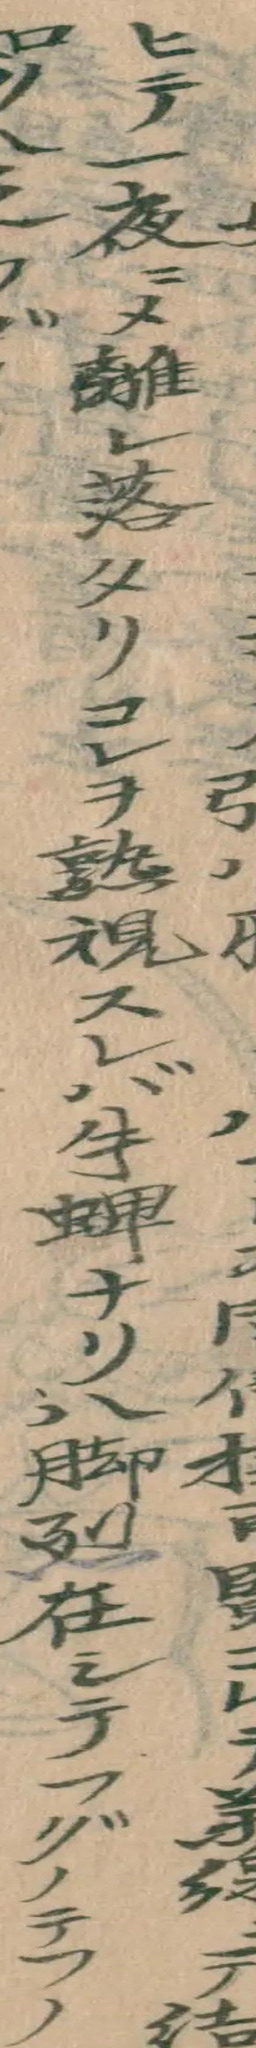ヒテ一夜ニシテ離レ落タリコレヲ熟視スレバ牛蜱ナリ八脚列在シテフグノテフノ
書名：千蟲譜 3巻. [1]
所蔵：国立国会図書館 National Diet Library, JAPAN
